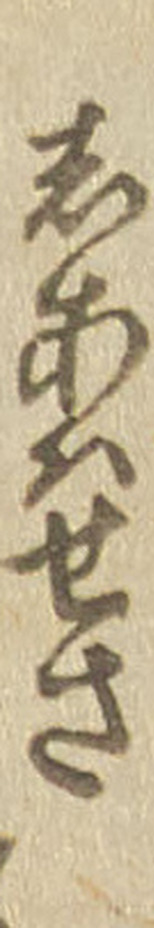しあはせさ
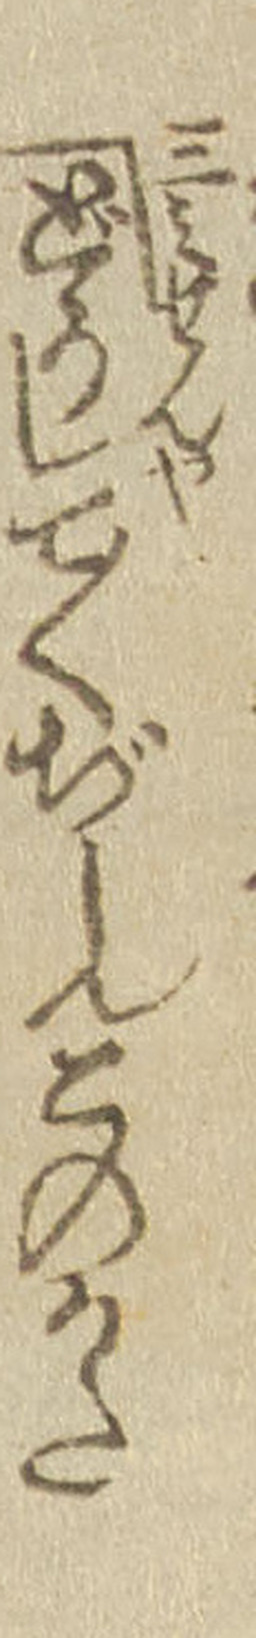「どうして〳〵ぢしんこのかた
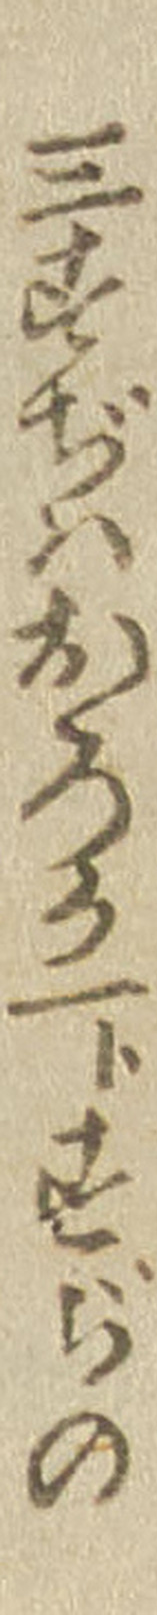三すぢはおろか一とすぢの
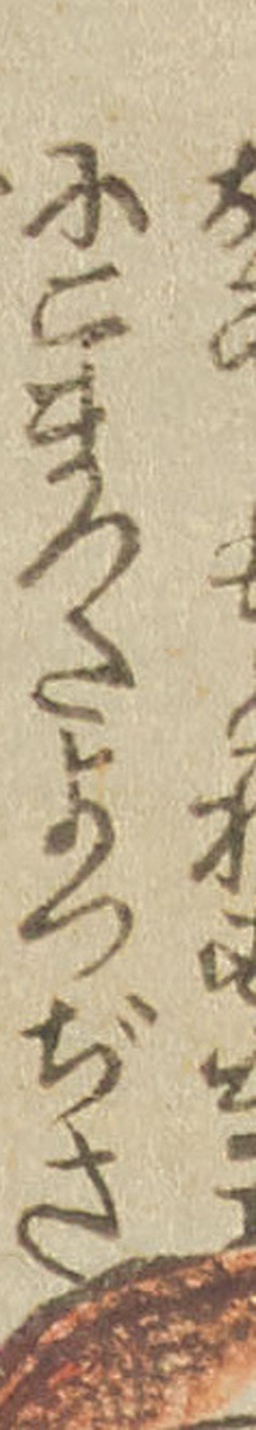にこまつたよつぢさ
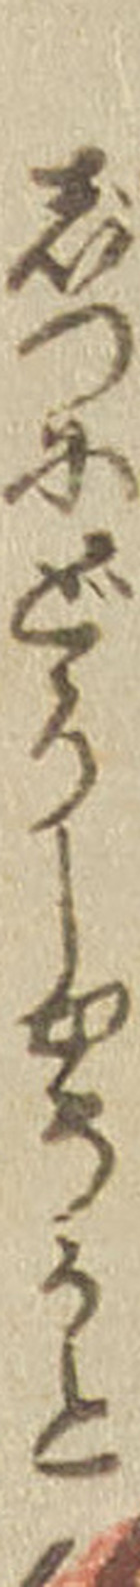じつにどうしやうかと
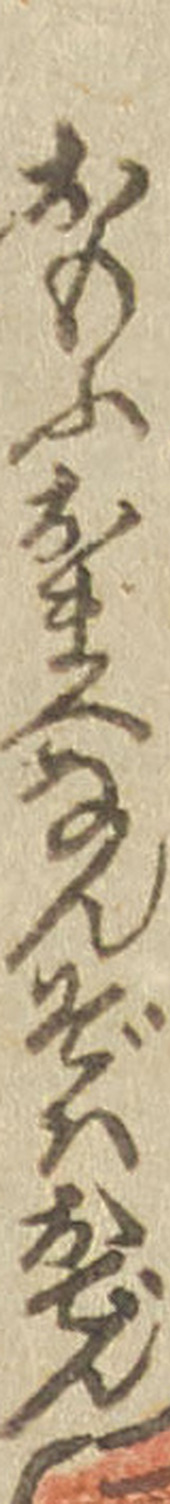おもふおまへなんぞはおでん
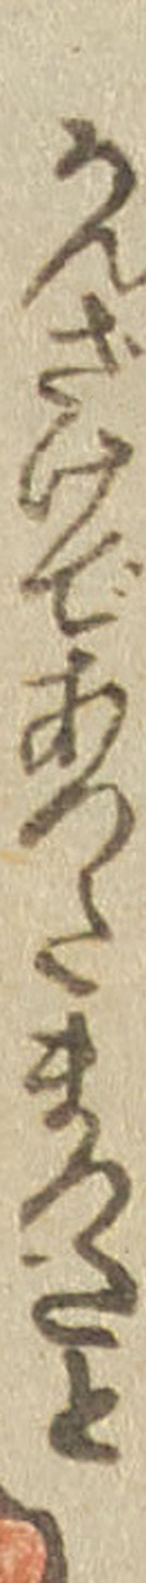かんざけであつたまつたと
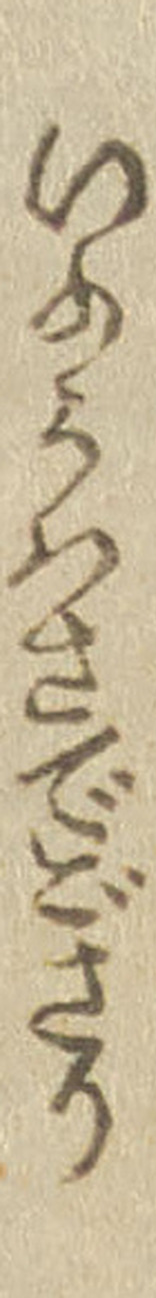いふうはさでごさり
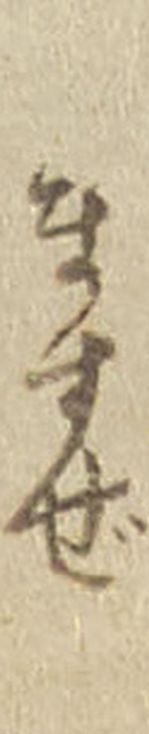ますぜ
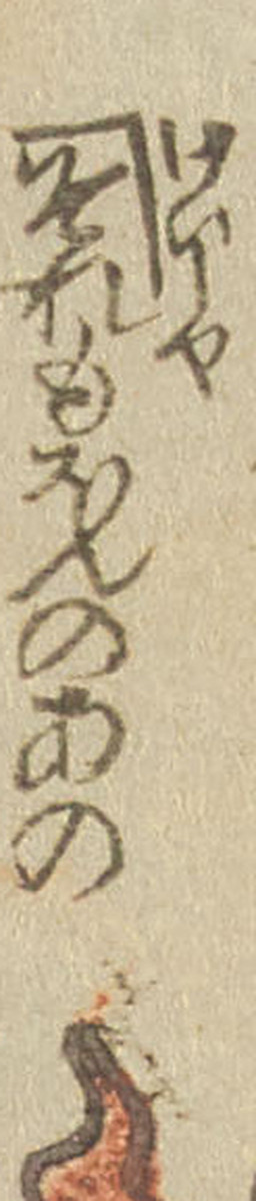「それもほんのあの
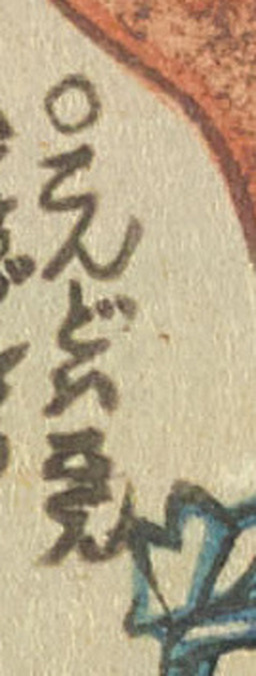○こんどはきん
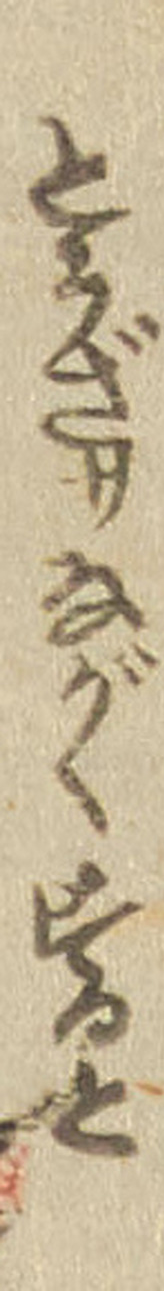とうざさながくすると
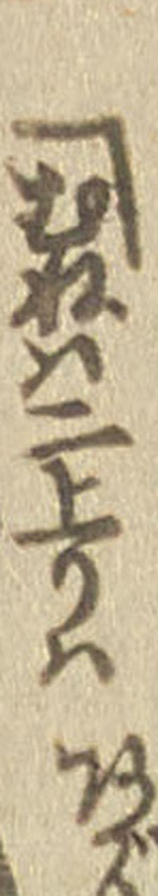「むねは二上がりは
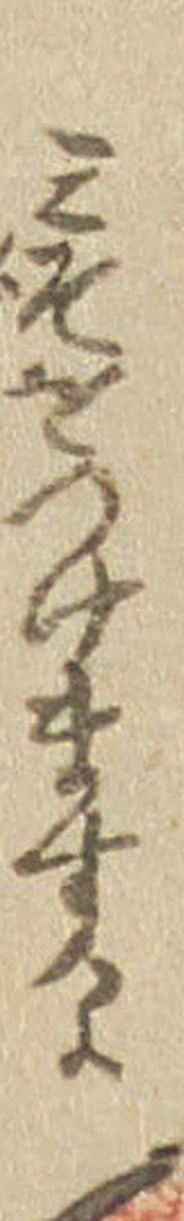みそをつけますよ
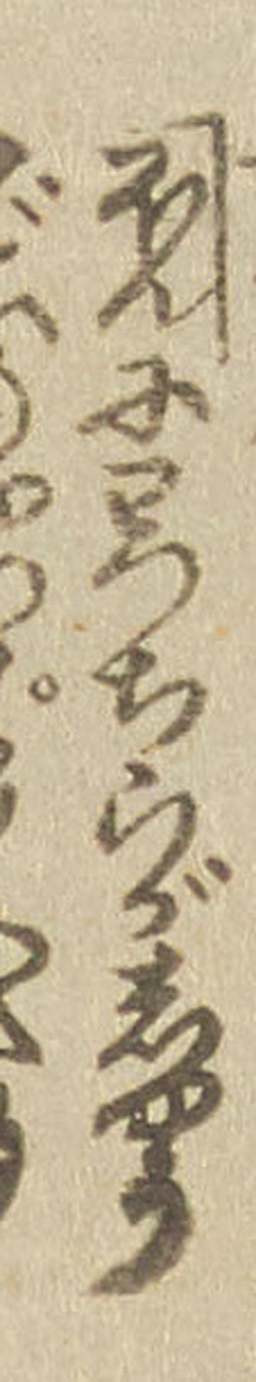「ほんにわつちらがしやう
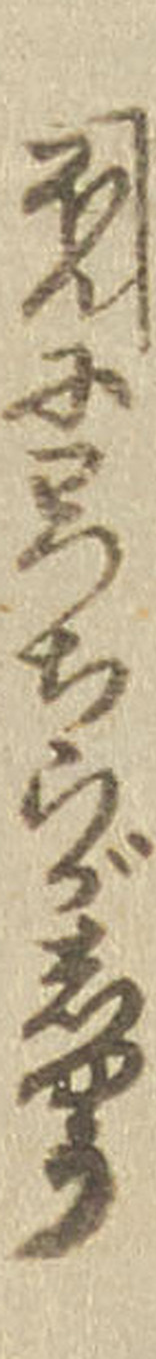「ほんにわつちらがしやう
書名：骨抜どうせうなまづ大家破焼
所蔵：東京大学総合図書館 General Library in the University of Tokyo, JAPAN
